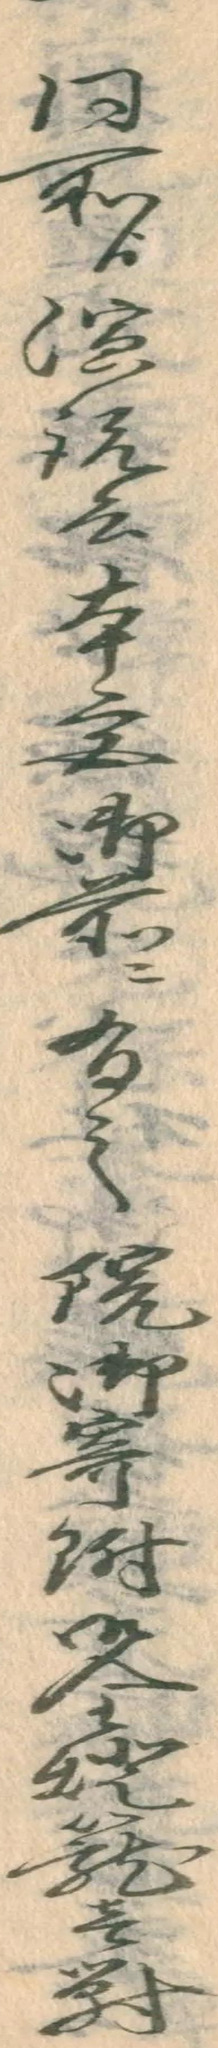一同所ゟ演説云本宮御前ニ有之院御寄附御金燈籠壱対
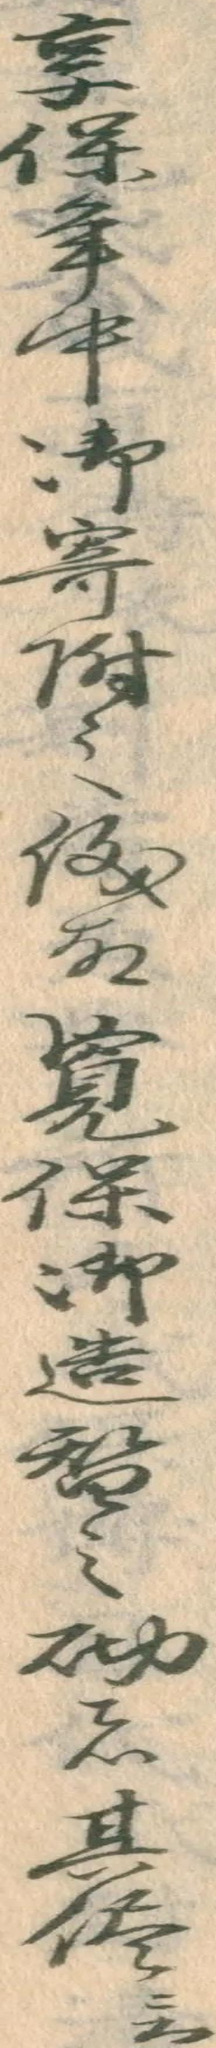享保年中御寄附之儀故寛保御造替之砌は其侭ニ而
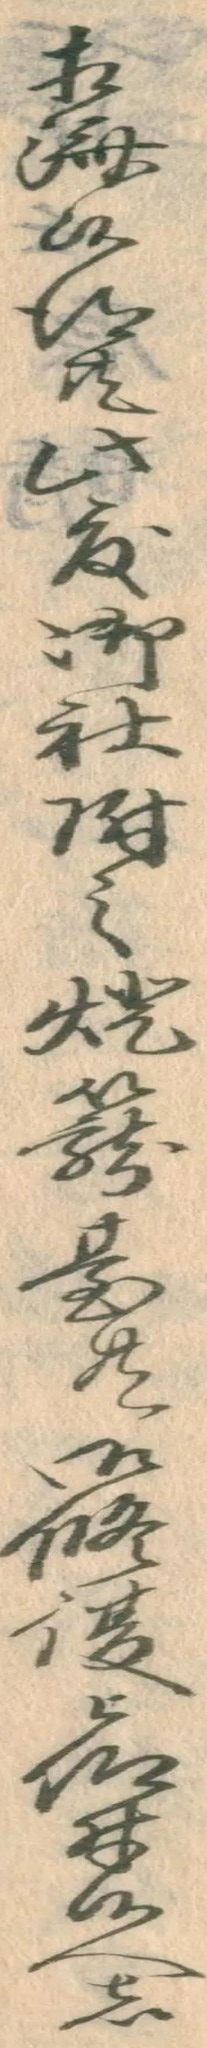相済候得共此度御社附之燈籠台共御修復被仰付候へは
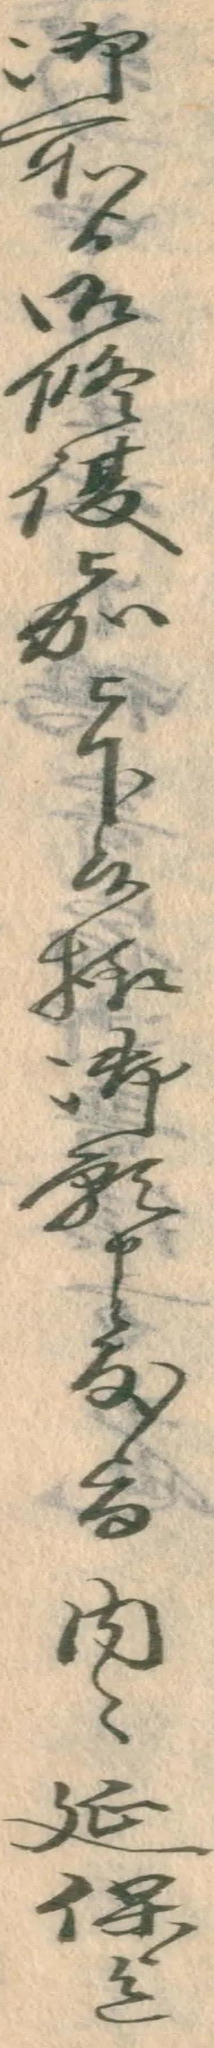御所ゟ御修復被加被下候様御願申度旨内々延保迄
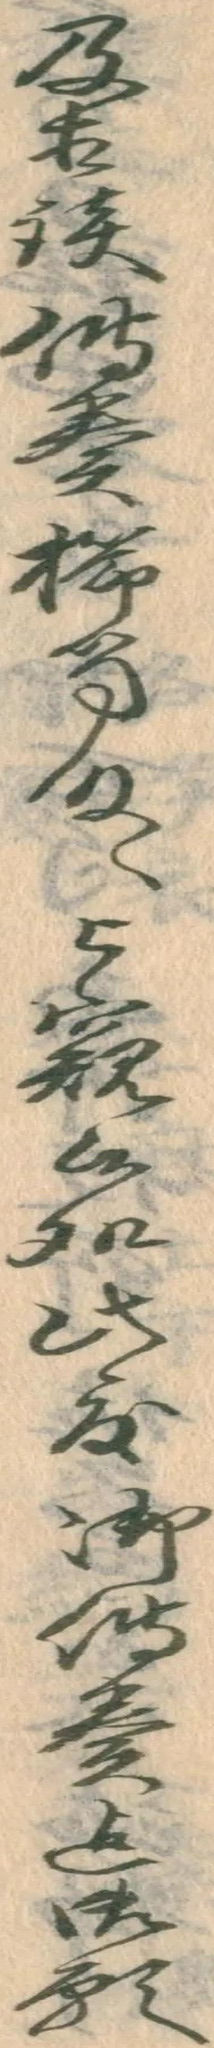及相談伝奏櫛笥殿へ被窺候処此度御伝奏迄御願
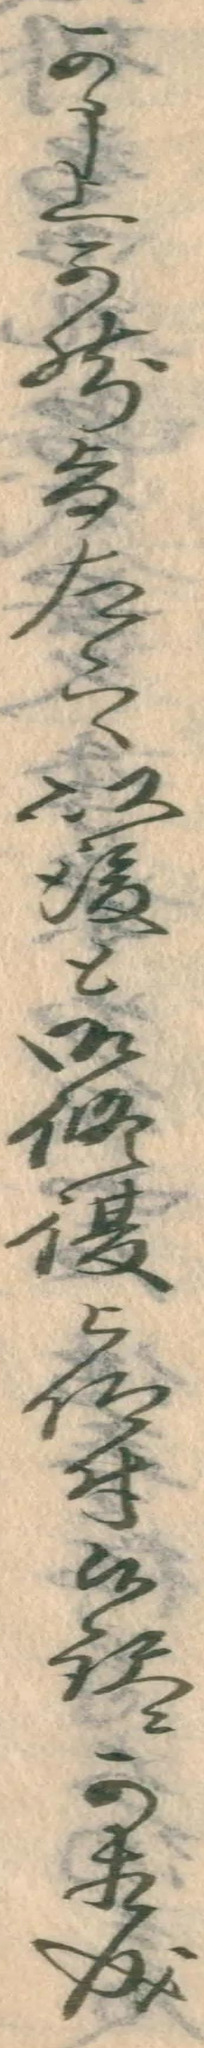可申上可然旨左候ハヽ以後も御修復被仰付候訳ニ可相成
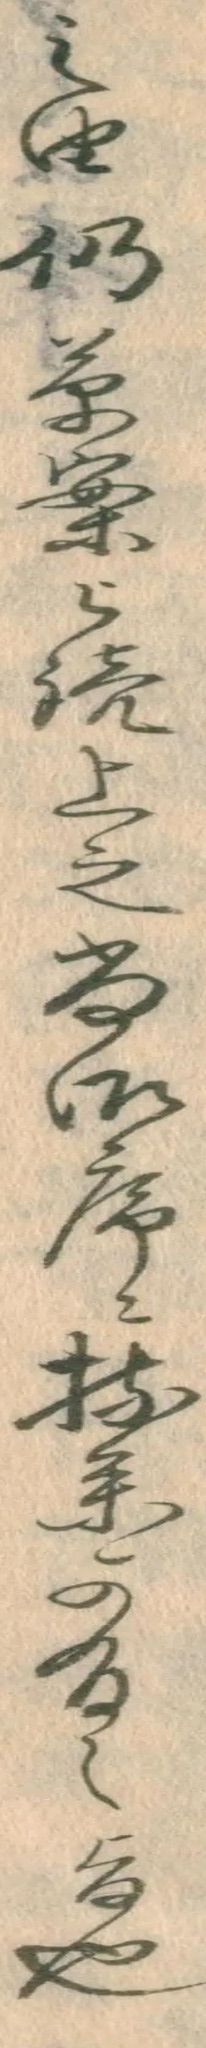之由仍草案被読上之尚御序ニ持参可有之旨也
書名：賀茂社記録. 第17冊
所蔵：国立国会図書館 National Diet Library, JAPAN
